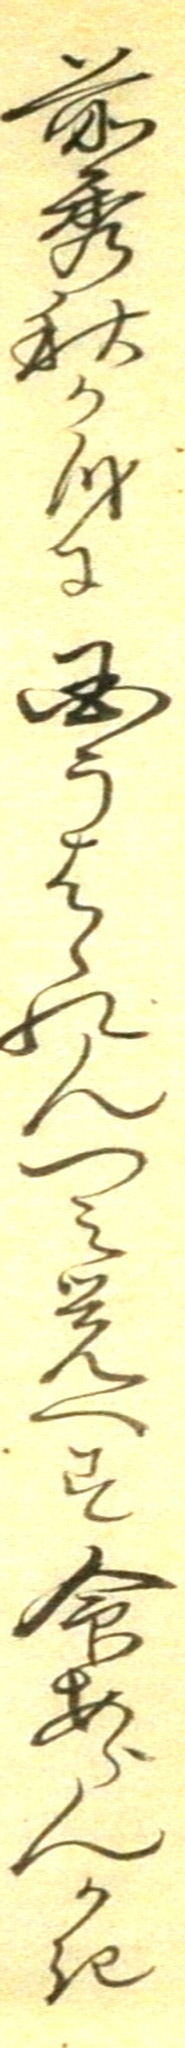前秀秋か身に玉うはゝ同ゝれんつみ覚へす命あらんかき
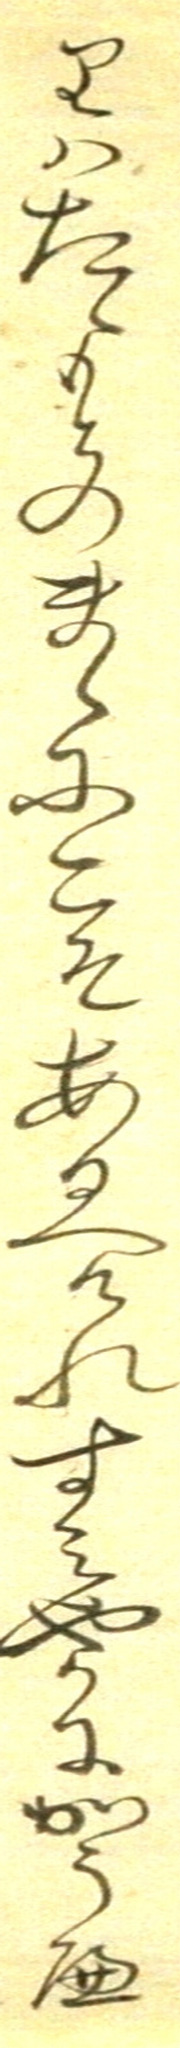りはたゝもｔもとのまゝにこそあるへけれすみやかにかうへ
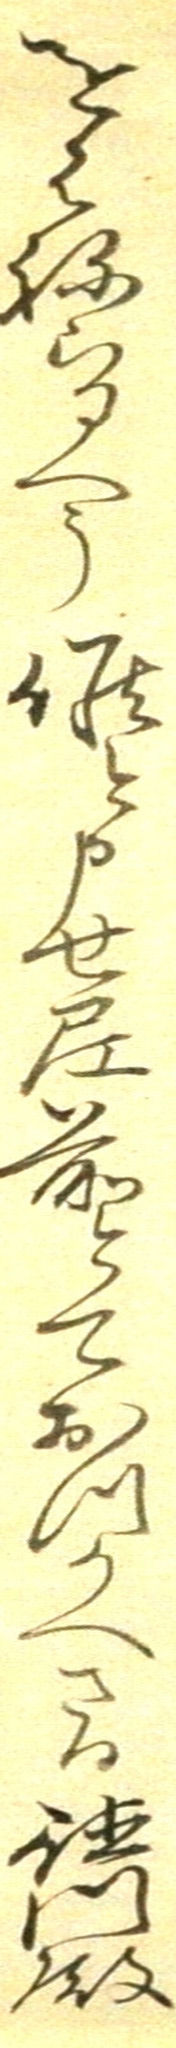をはねらるへう候と申せ尼前とておつかへさる徳川殿
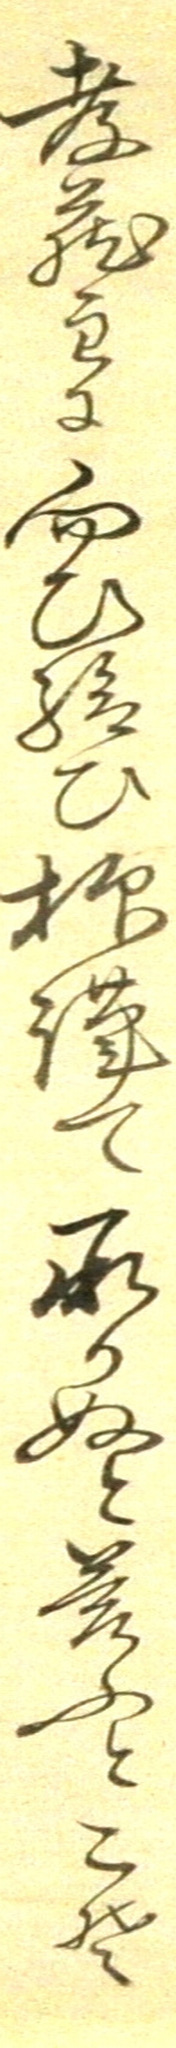孝蔵主に向ひ給ひ仰謹て承りぬと答ふとこそ
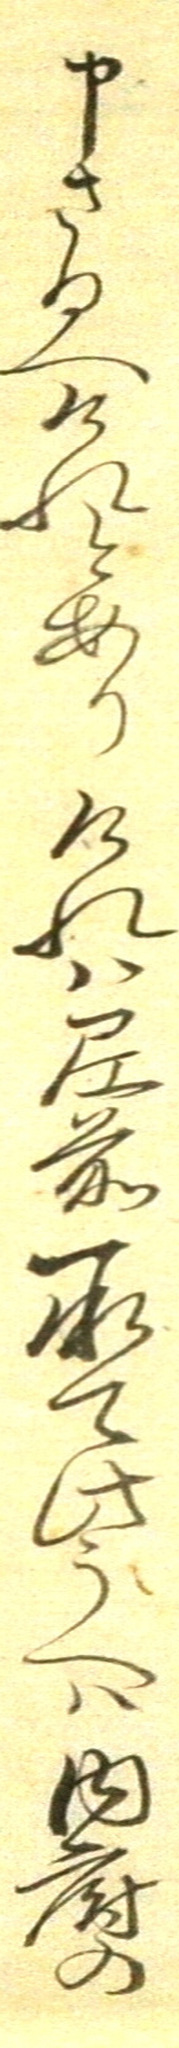申さるへけれとありけれは尼前承て此うへは内府の
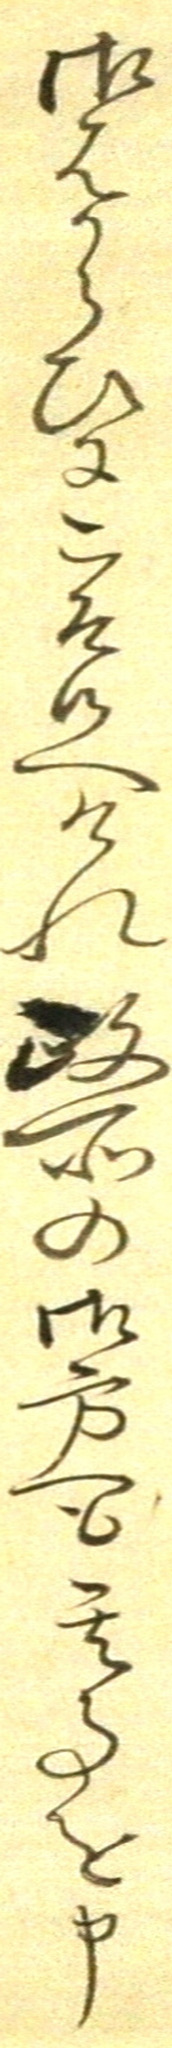お御はからひにこそ候へけれ政所の御方へも其事を申
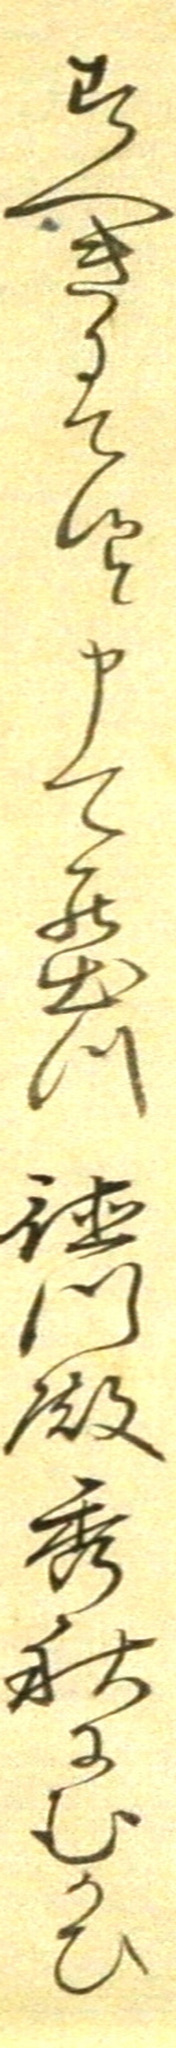すへきにて候と申て罷出つ徳川殿被秋にむかひ
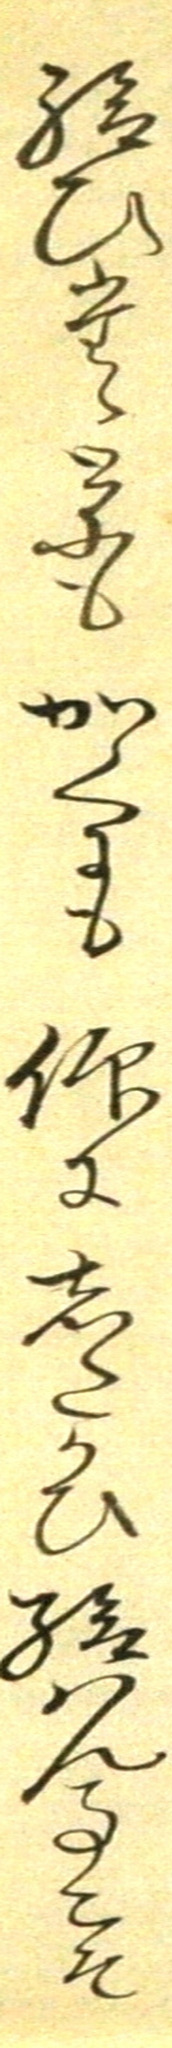給ひたゝとふもかくにも仰にしたかひ給はん事こそ
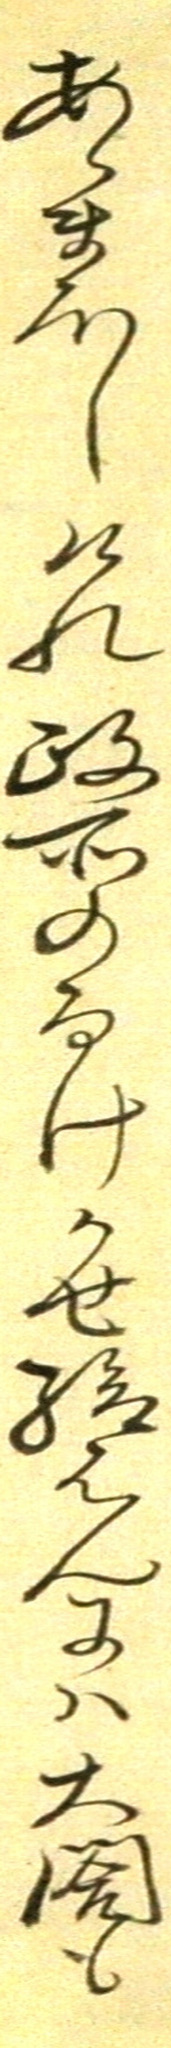あらまほしけれ政所のなｋなけかせ給はんには太閤も
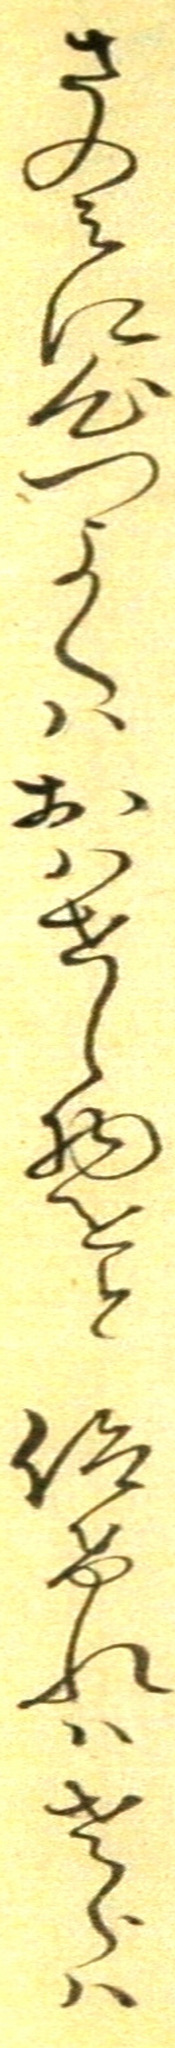さのみに心つよくはおはせし物をと仰けれはさらは

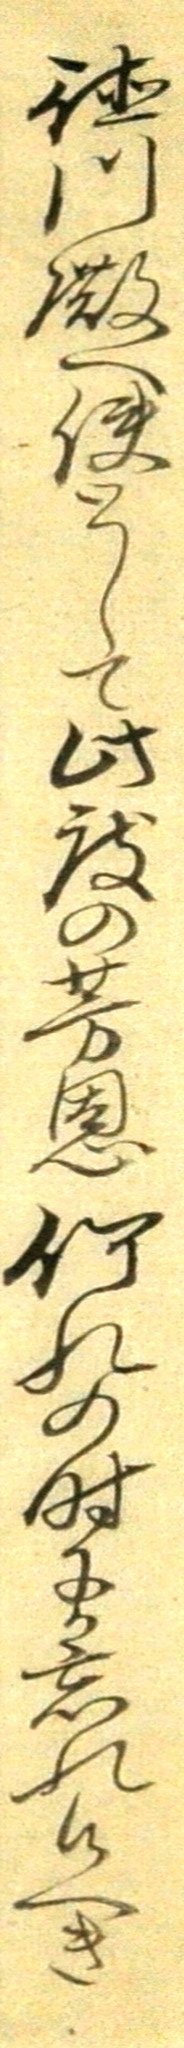徳川殿へ使として此度の芳恩何れの時にか忘れ候へき
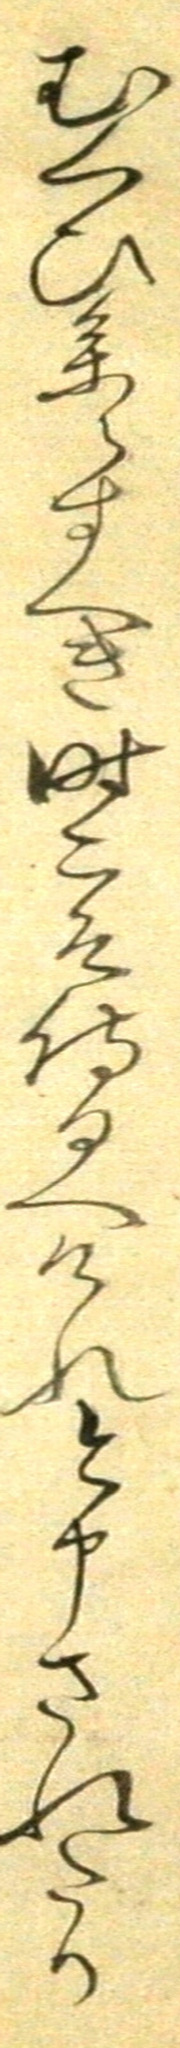むくひ参らすへき時こそ侍るへけれと申されたり
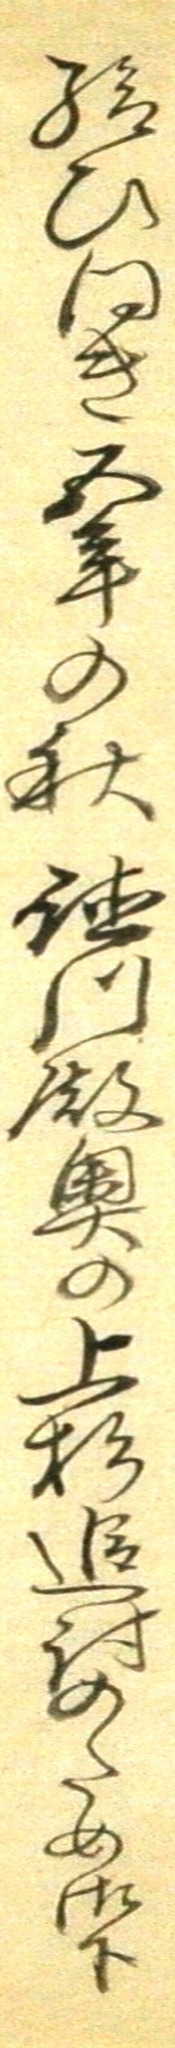給ひ同き五年の秋徳川殿奥の上杉追討のため御下
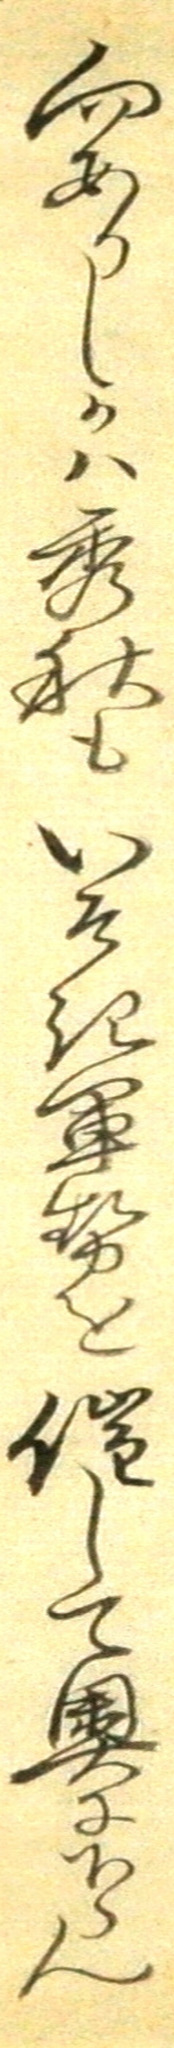向ありしかは秀秋もいそき軍勢を催して奥に下らん
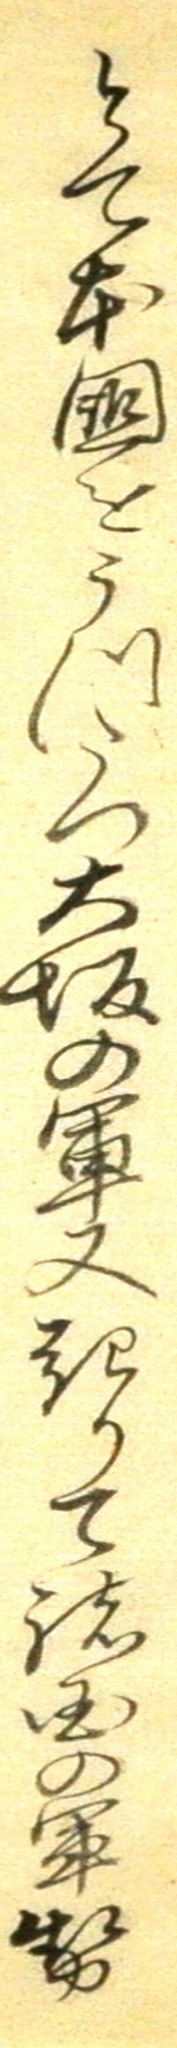とて本国をうつたつ大坂の軍又起りて諸国の軍勢
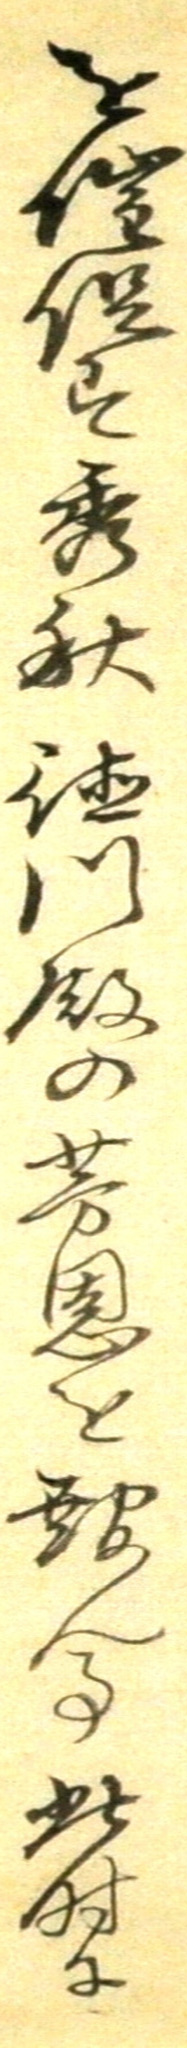を催促す秀秋徳川殿の芳恩を報ん事此時に
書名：藩翰譜（十二・上）
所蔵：伊那市立高遠町図書館・合同会社AMANE
